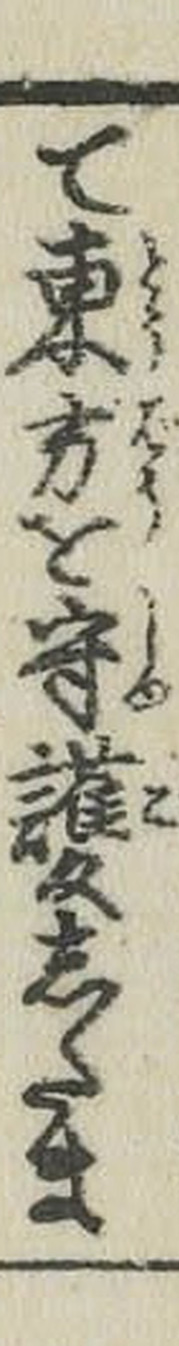て東方を守護したま
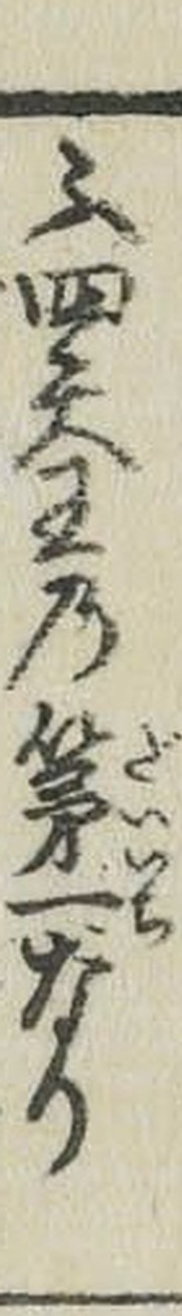ふ四天王の第一なり
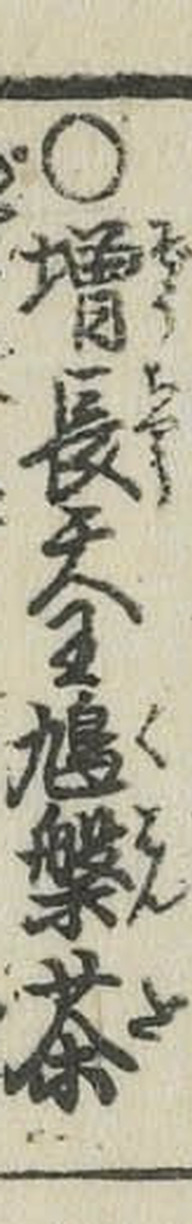○増長天王鳩槃荼
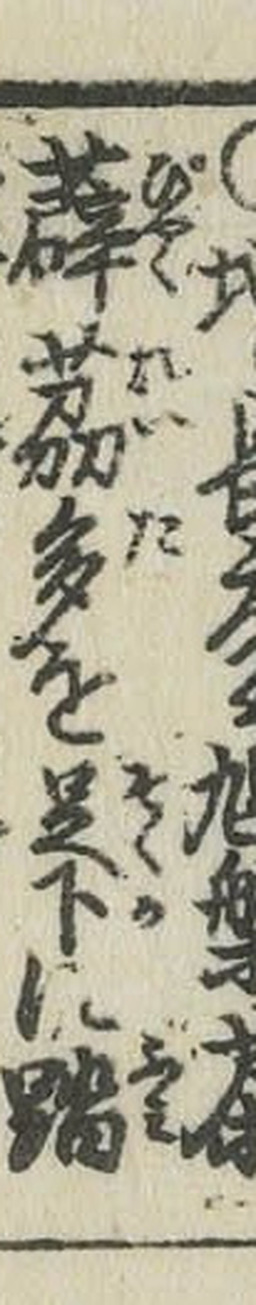薜茘多を足下に踏
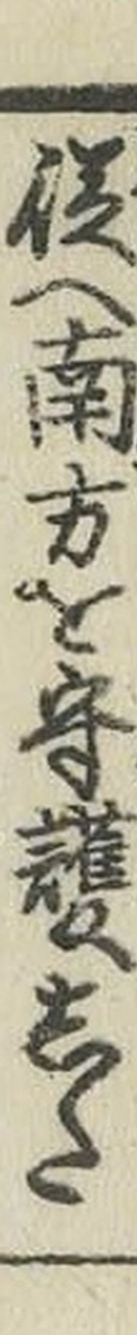従へ南方を守護した
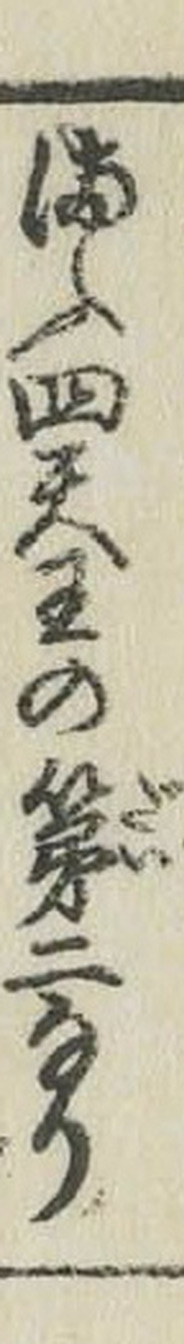まふ四天王の第二なり
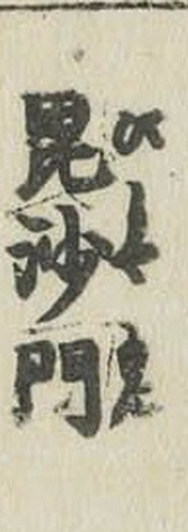毘沙門
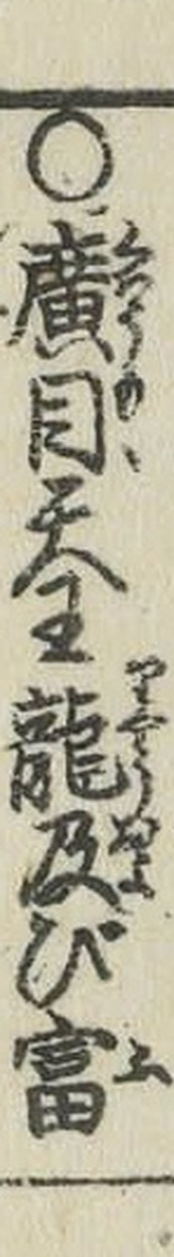○広目天王龍及び富
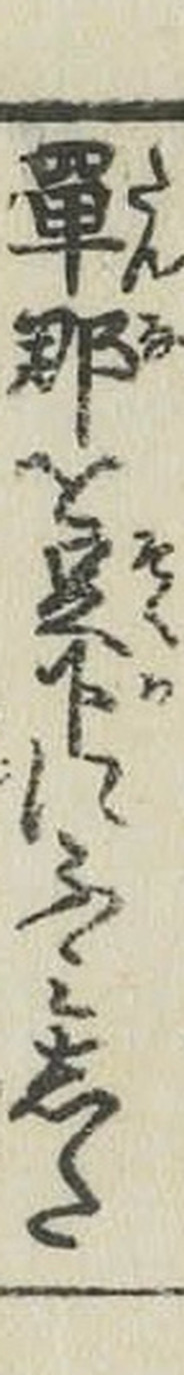単那を足下にふみした
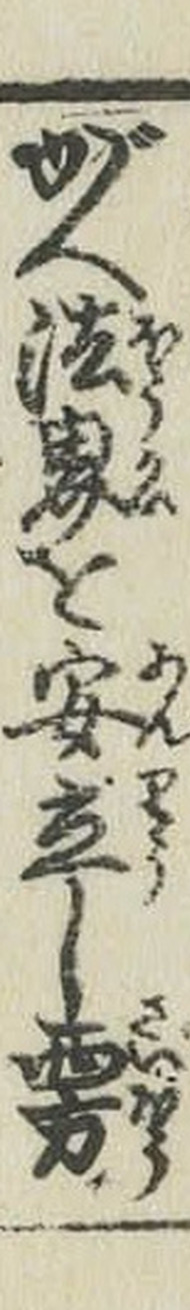がへ法界を安立し西方
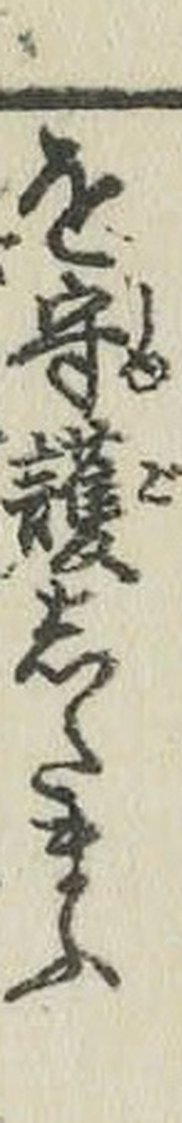を守護したまふ
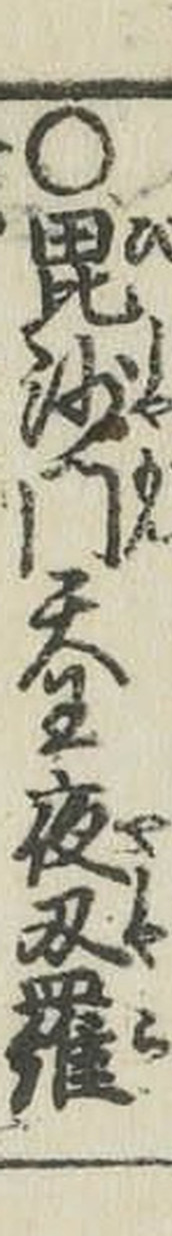○毘沙門天王夜叉羅
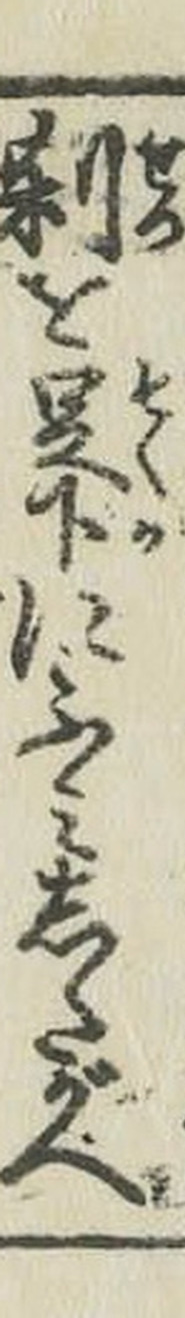刹を足下にふみしたがへ
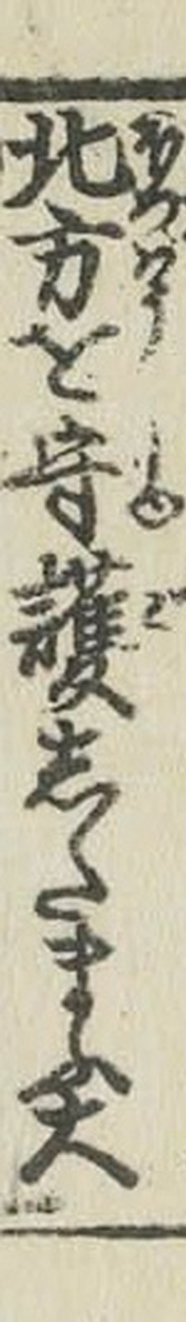北方を守護したまふ大
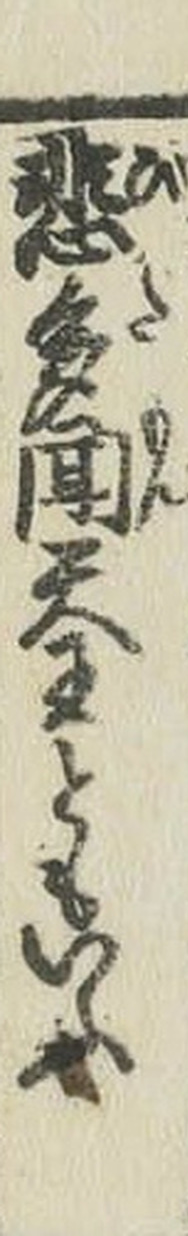悲多聞天王ともいふ
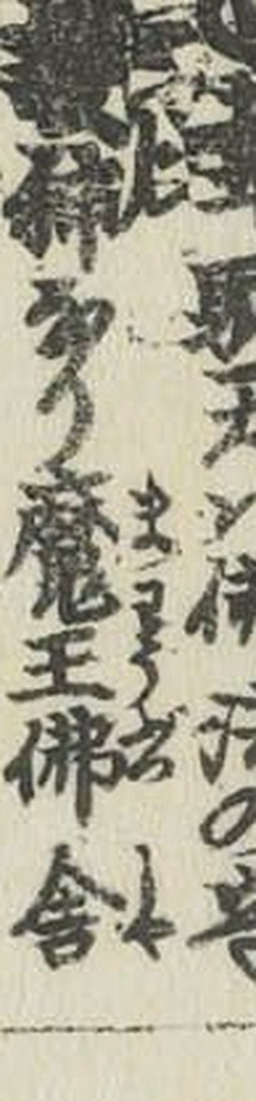護神なり魔王佛舎
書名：増補頭書訓蒙図彙大成 10巻 10:巻之21
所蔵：東京学芸大学教育コンテンツアーカイブ
